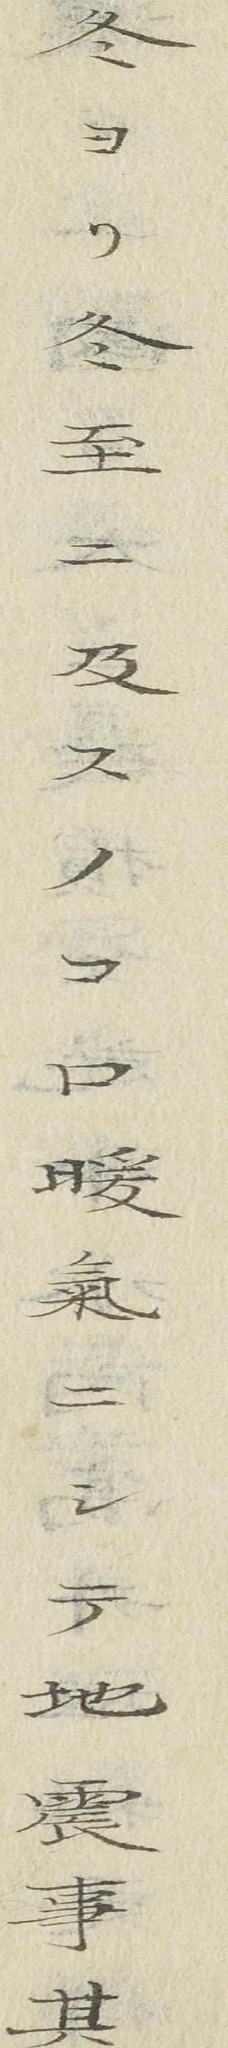冬ヨリ冬至ニ及スノコロ暖気ニシテ地震事其
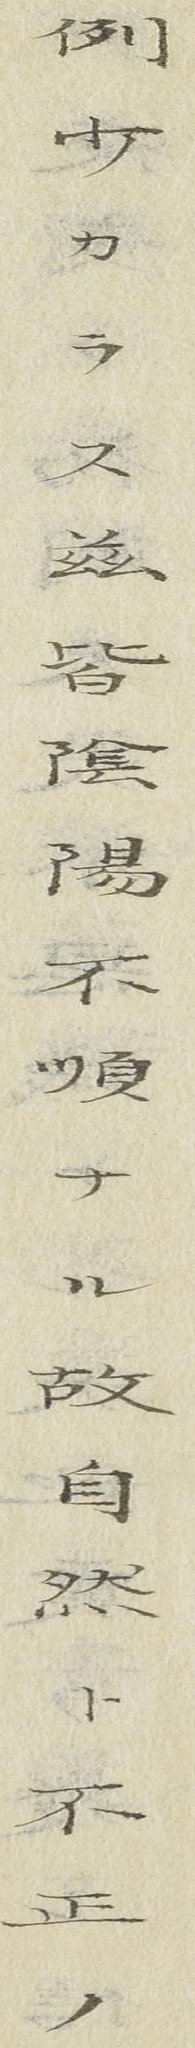例少カラス茲皆陰陽不順ナル故自然ト不正ノ
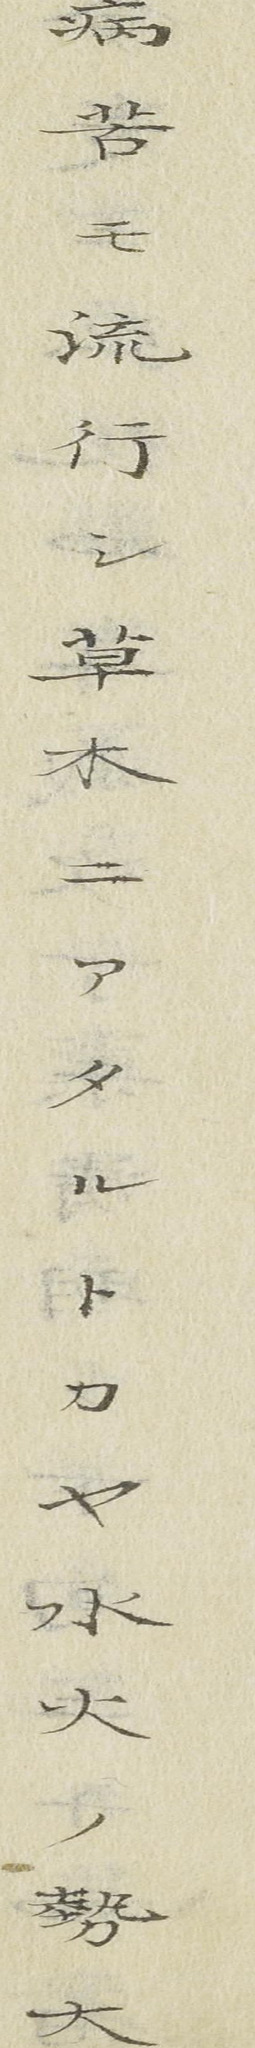病苦モ流行シ草木ニアタルトカヤ水火ノ勢大
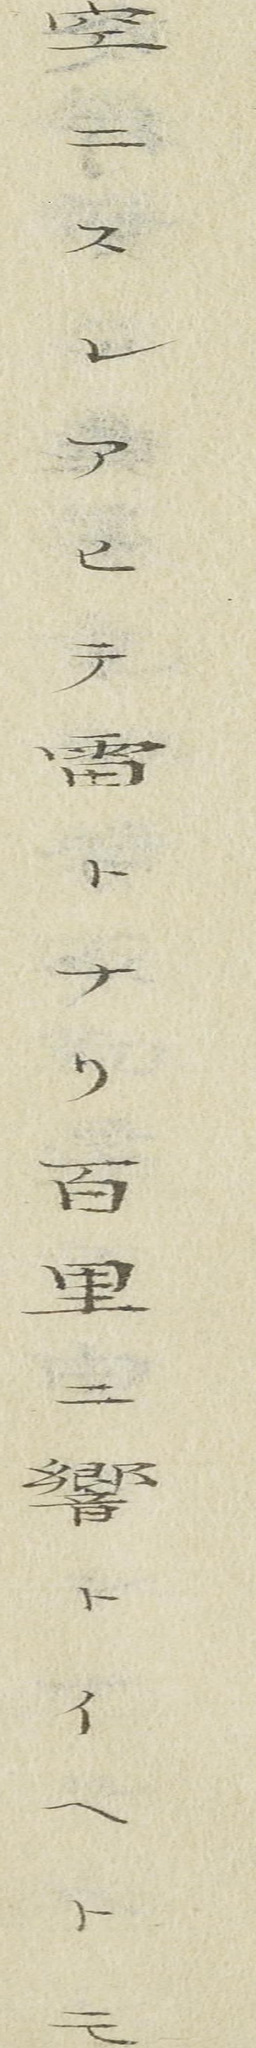空ニスレアヒテ雷トナリ百里ニ響トイヘトモ
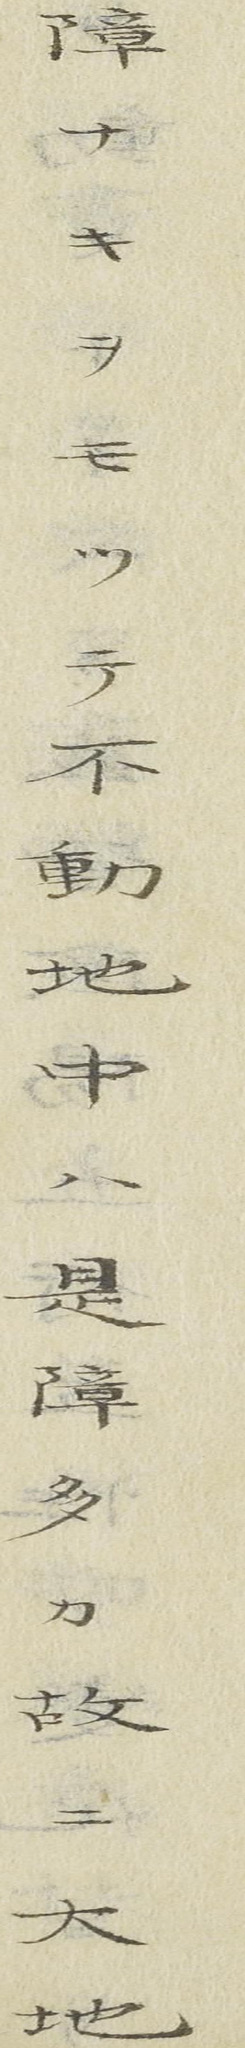障ナキヲモツテ不動地中ハ是障多カ故ニ大地

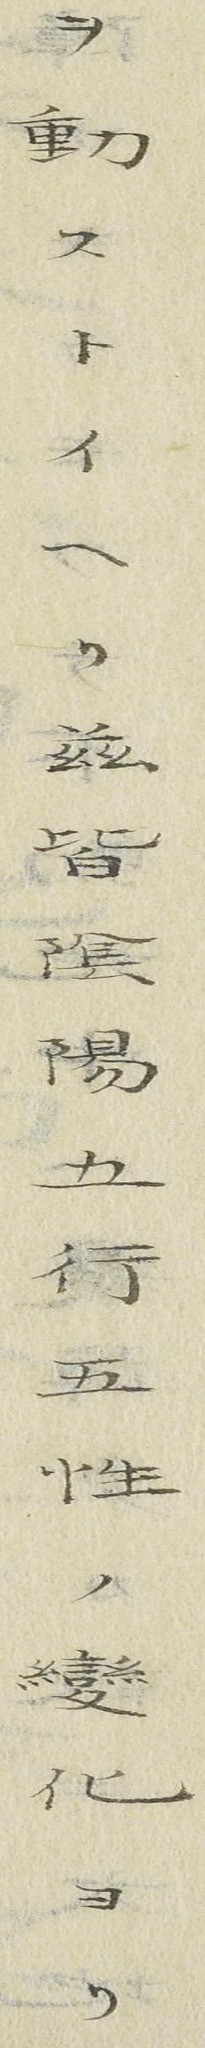ヲ動ストイヘリ玆皆陰陽五行五性ノ変化ヨリ
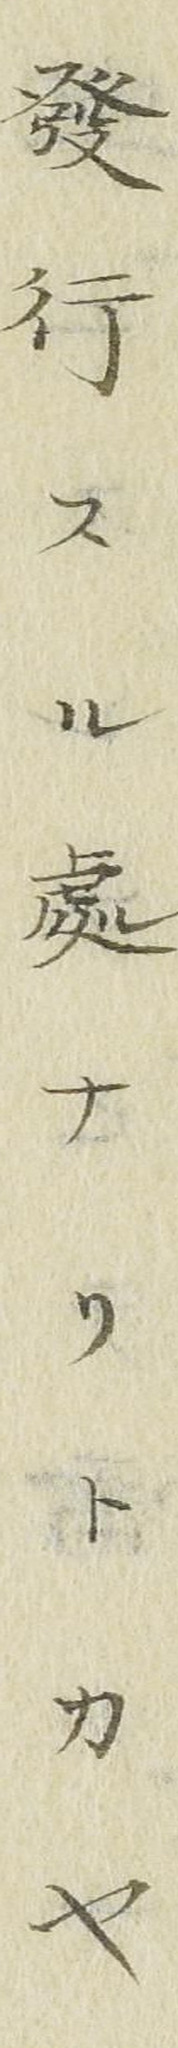発行スル処ナリトカヤ
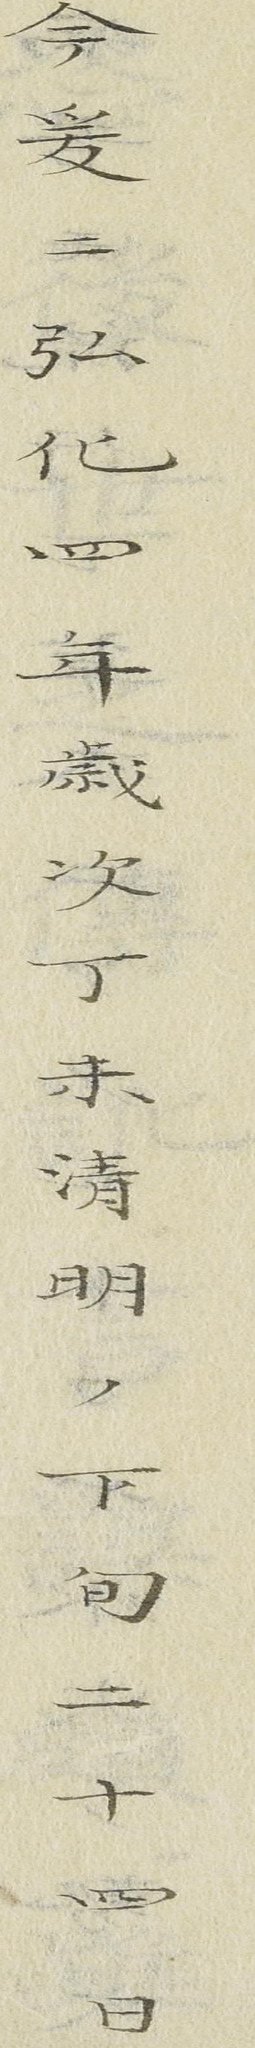今爰ニ弘化四年歳次丁末清明ノ下旬二十四日
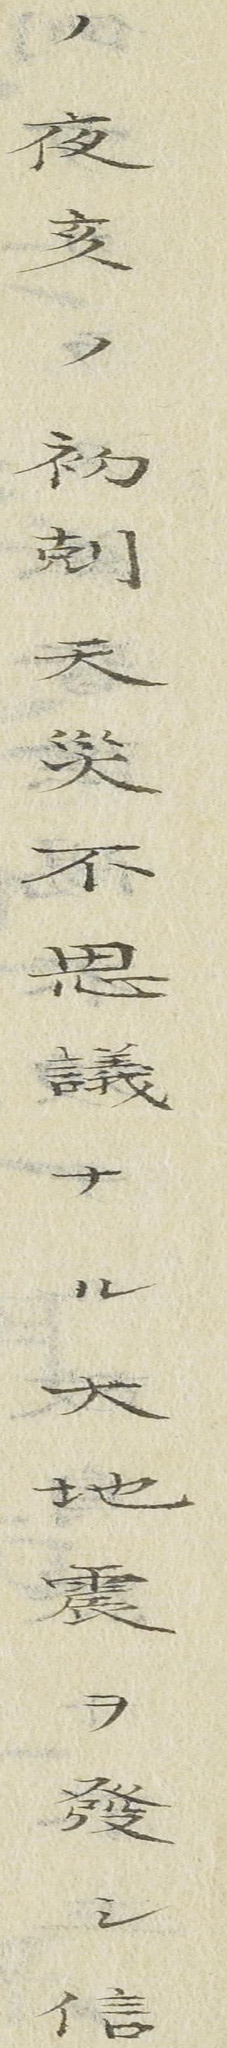ノ夜亥ノ初刻天災不思議ナル大地震ヲ発シ信
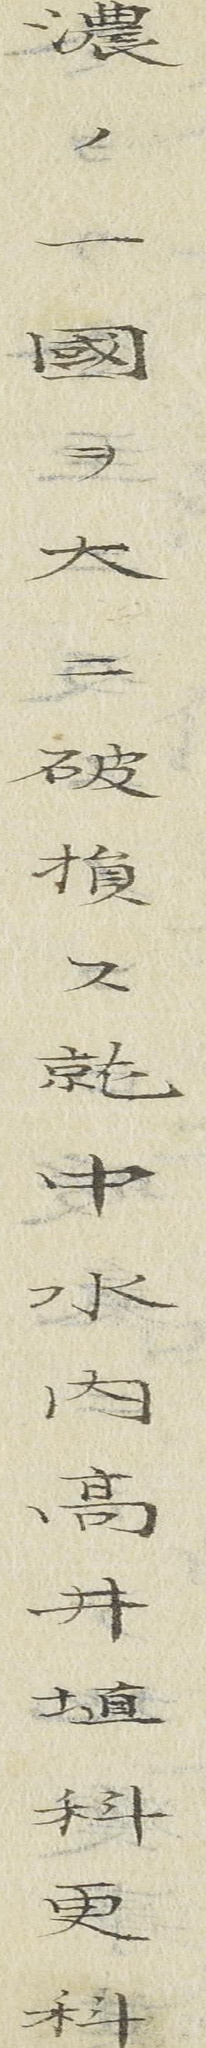濃ノ一国ヲ大ニ破損ス就中水内高井埴科更科
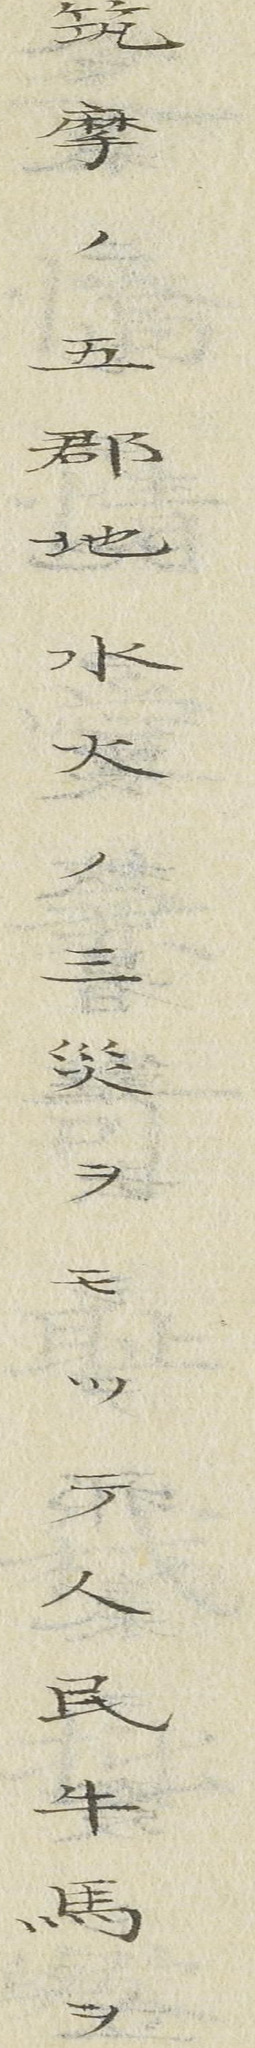筑摩ノ五郡地水火ノ三災ヲモツテ人民牛馬ヲ
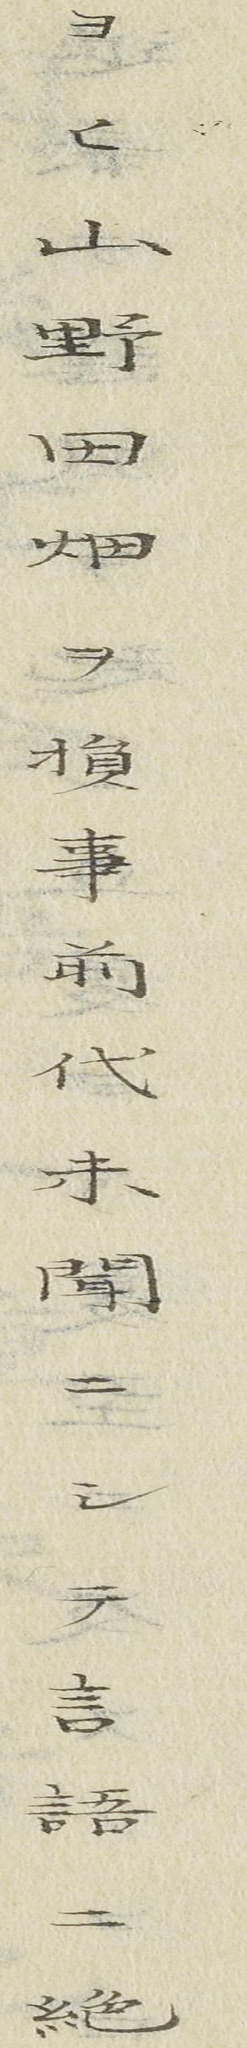ヨヒ山野田畑ヲ損事前代未聞ニシテ言語ニ絶
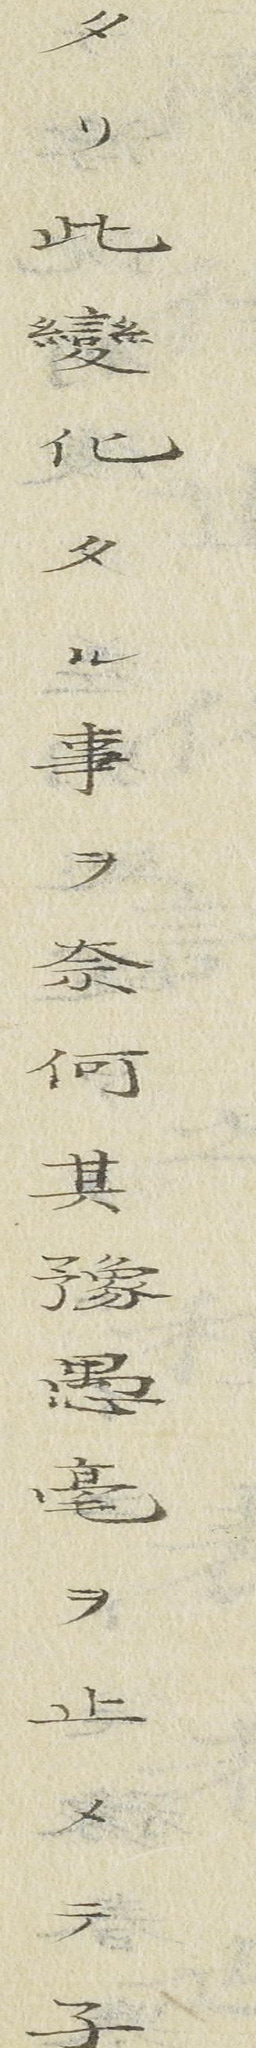タリ此変化タル事ヲ奈何其予愚毫ヲ止メテ子
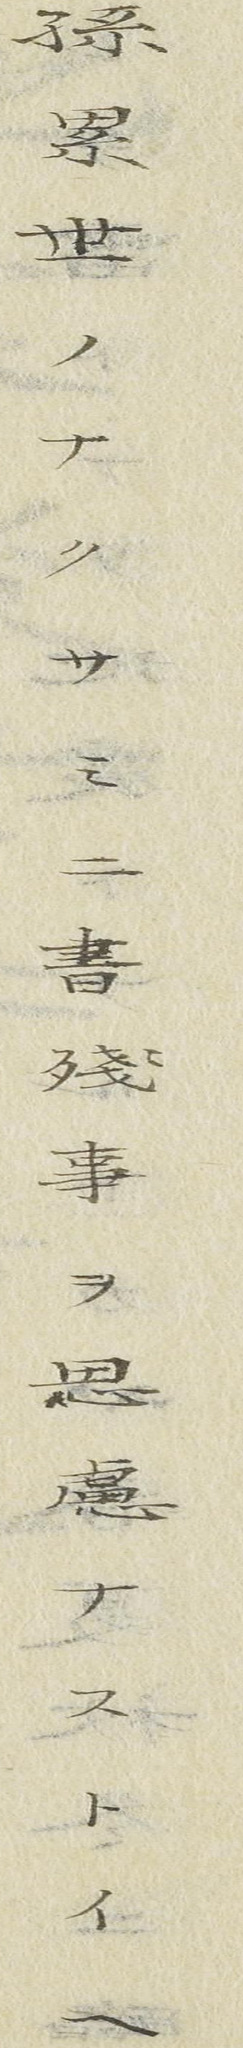孫累世ノナクサミニ書残事ヲ思慮ナストイヘ
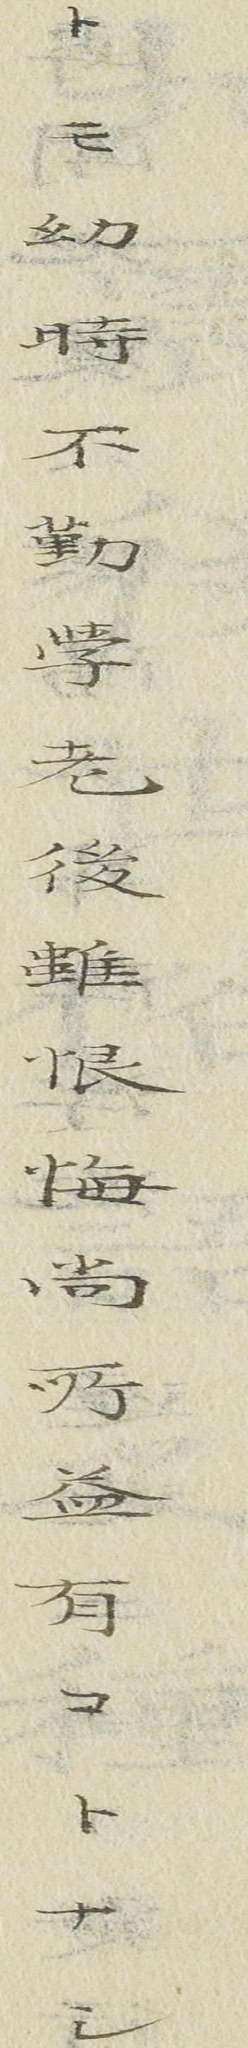トモ幼時不勤学老後雖恨悔尚所益有コトナシ
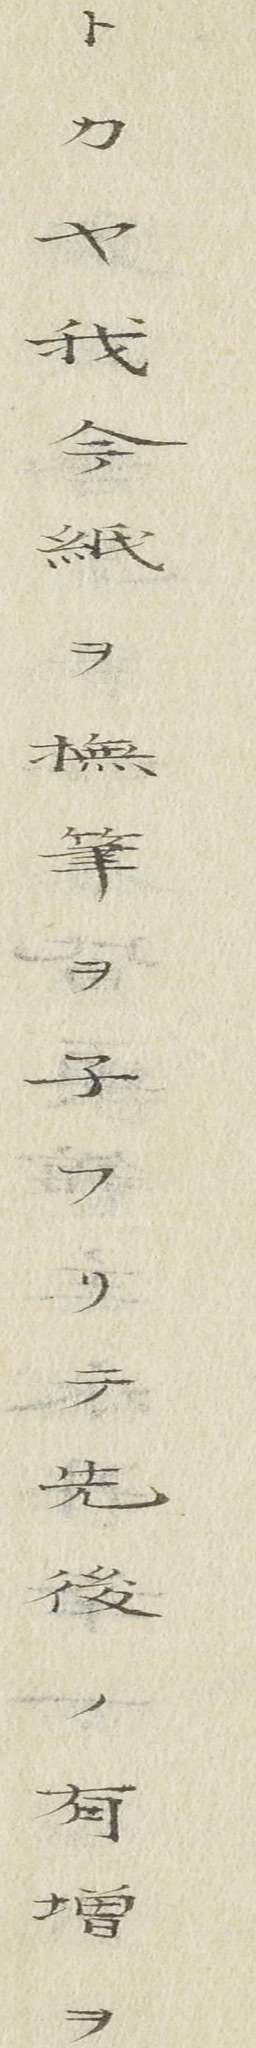トカヤ我今紙ヲ撫筆ヲ子フリテ先後ノ有増ヲ
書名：地災撮要　地震之部　巻ノ二
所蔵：東京大学地震研究所図書室 Earthquake Research Institute Library, The University of Tokyo, JAPAN
